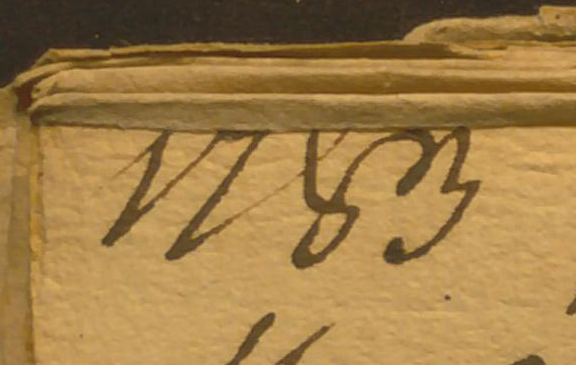17830
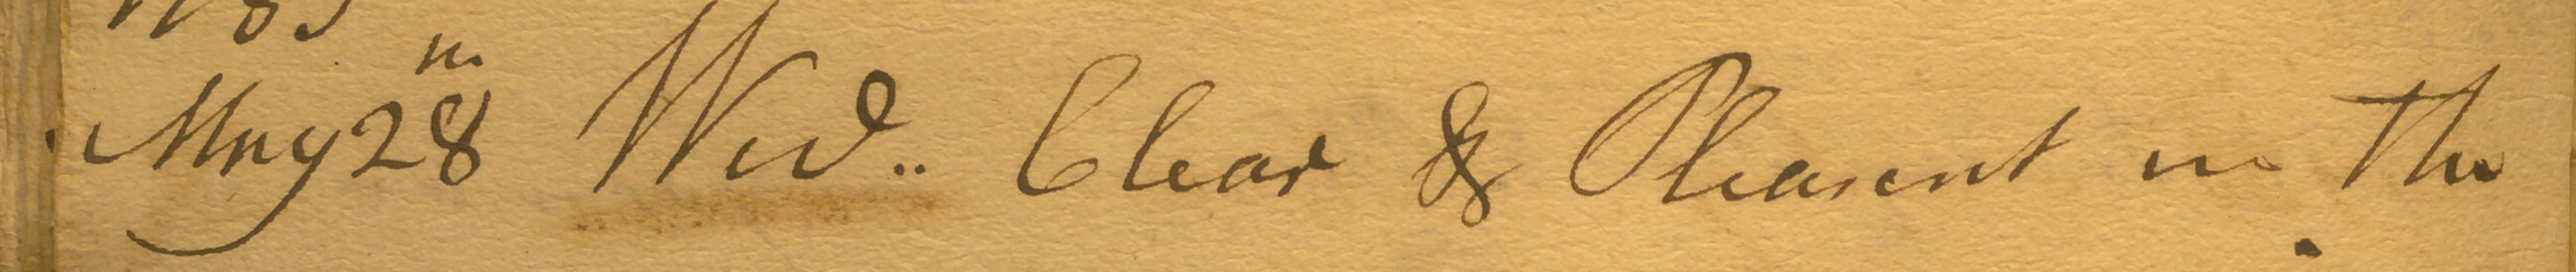May 28^th Wed. Clear & Pleasent in the
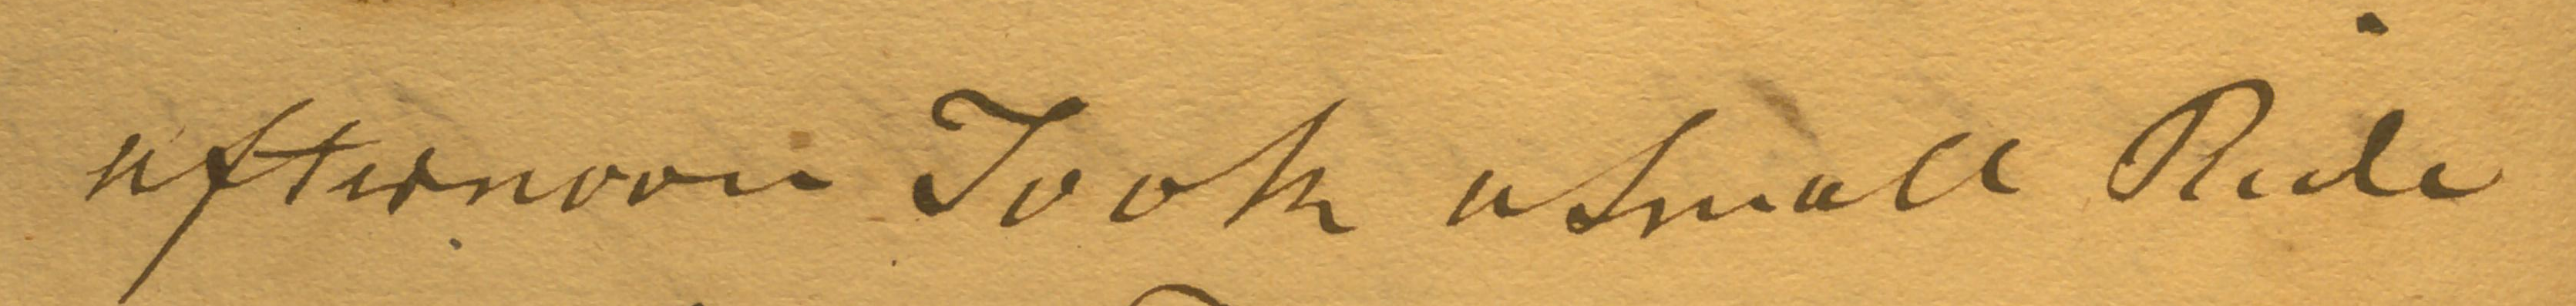afternoon Took a small Ride
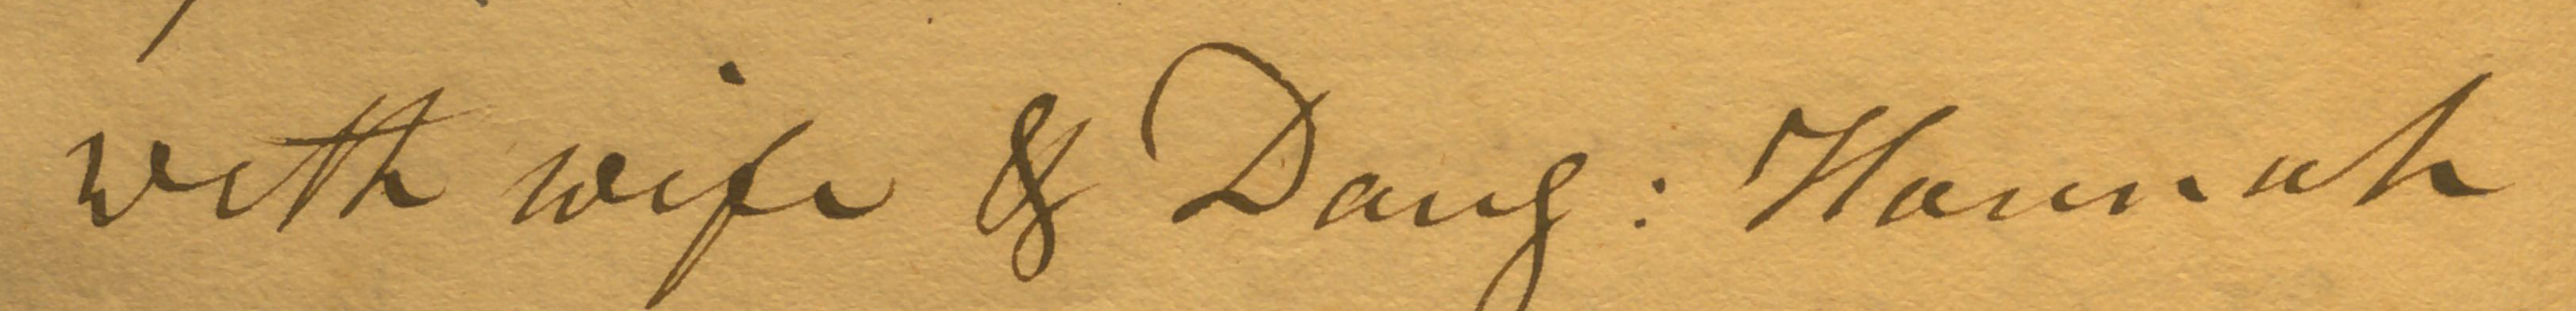with wife & Daug: Hannah
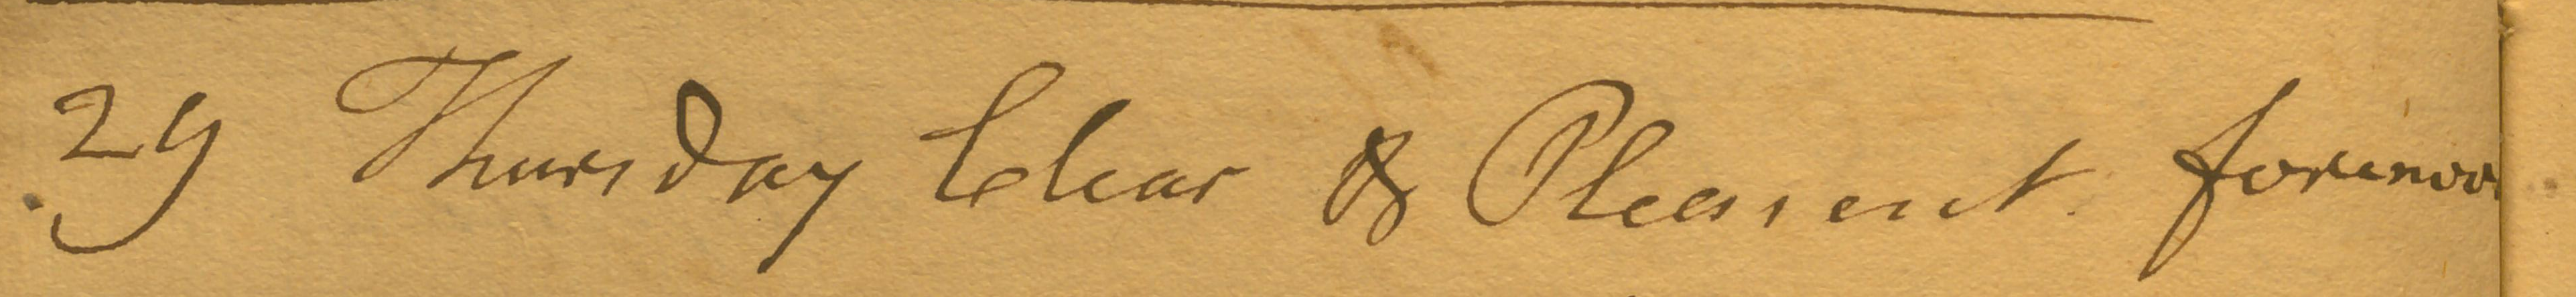29 Thursday Clear & Pleasent forenoon
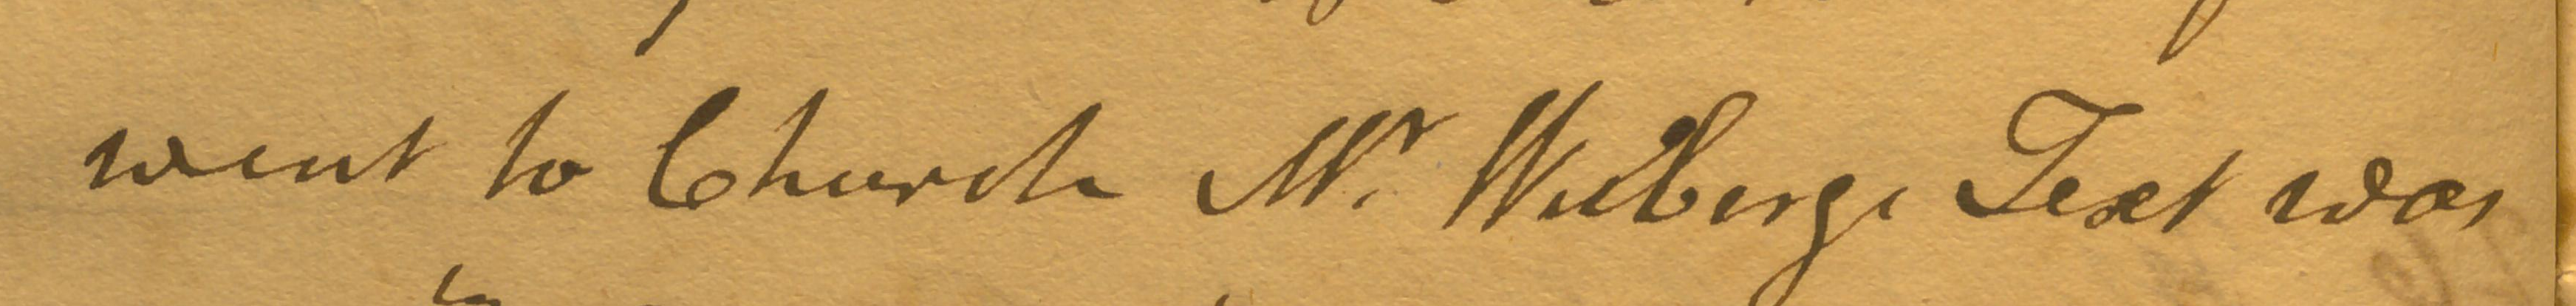went to Church M^r. Weibergs Text was
